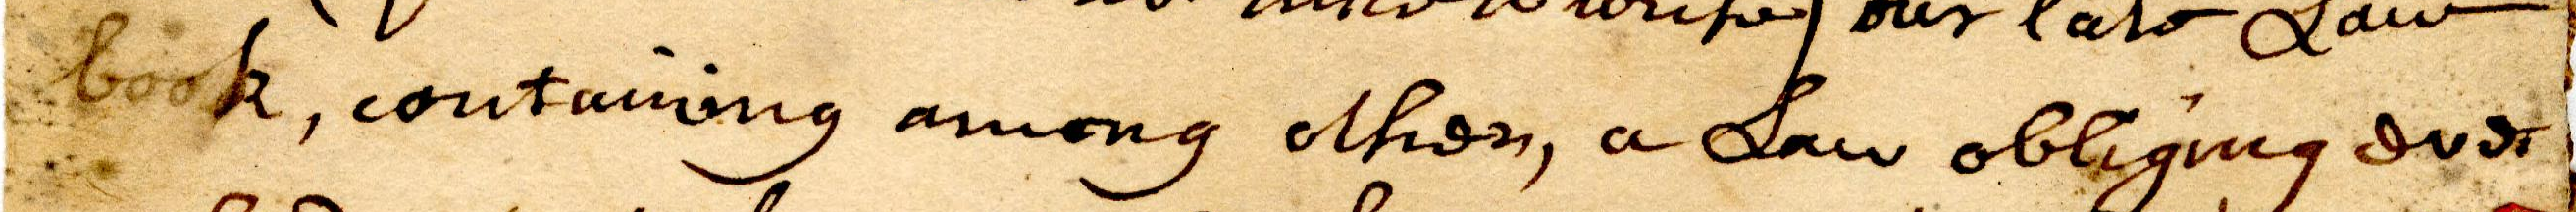book, containing among others, a Law obliging eve
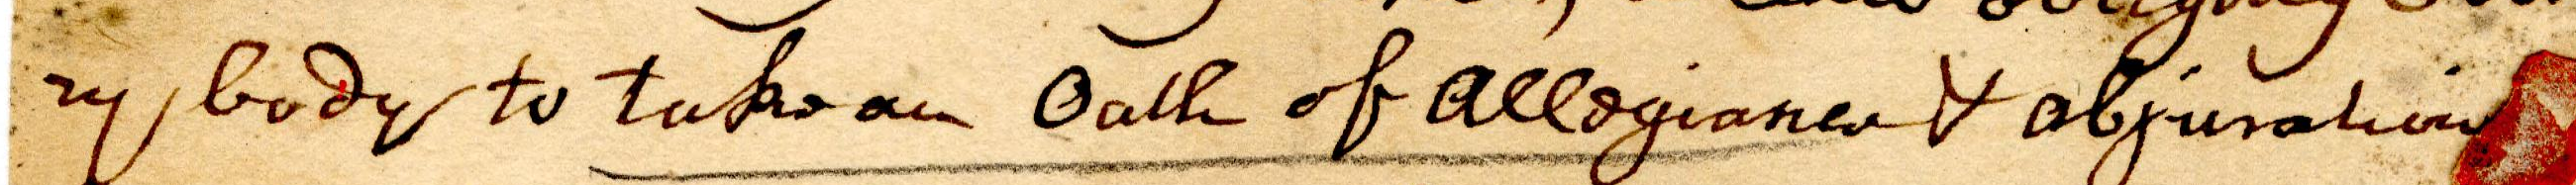ry body to take an Oath of Allegiance & abjuration
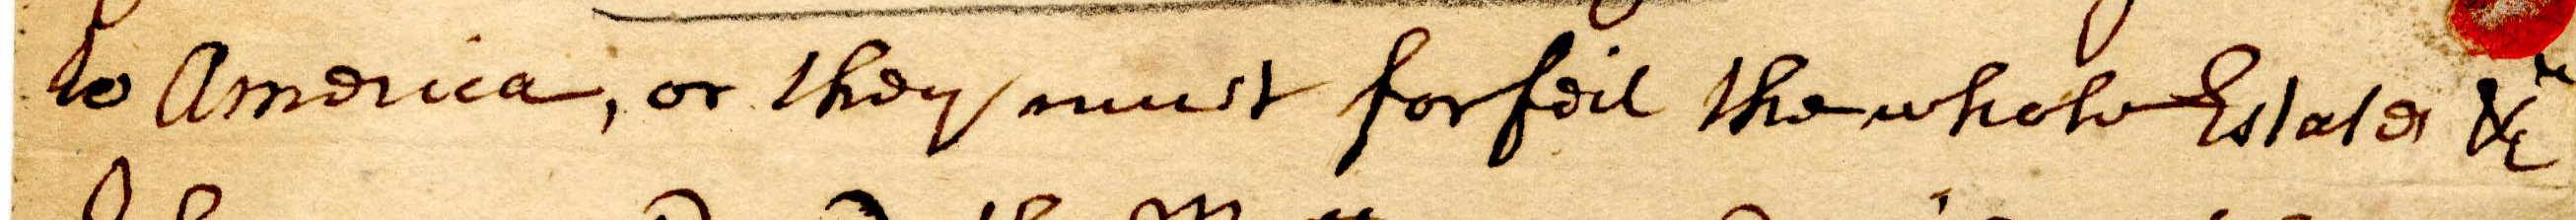to America, or they must for forfeit the whole Estate &c
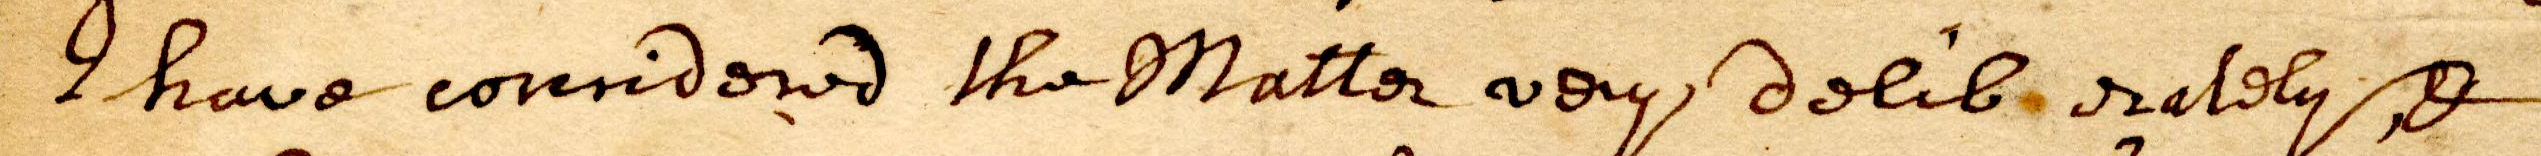I have considered the Matter very deliberately, &
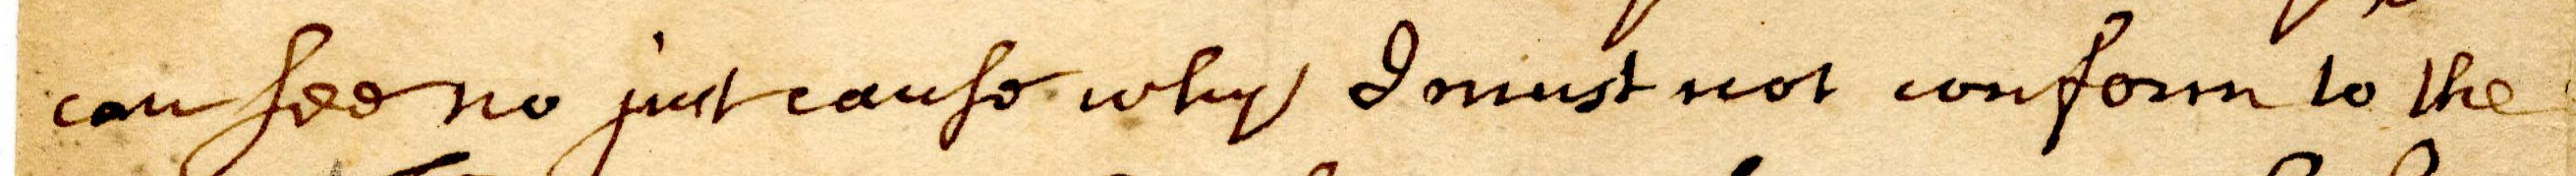can see no just cause why I must not conform to the
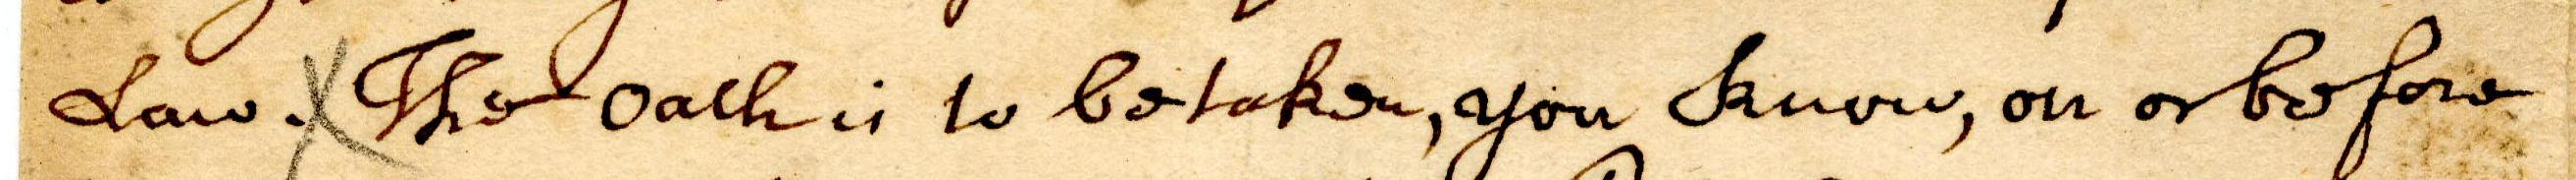Law. The Oath is to be taken, you know, on or before
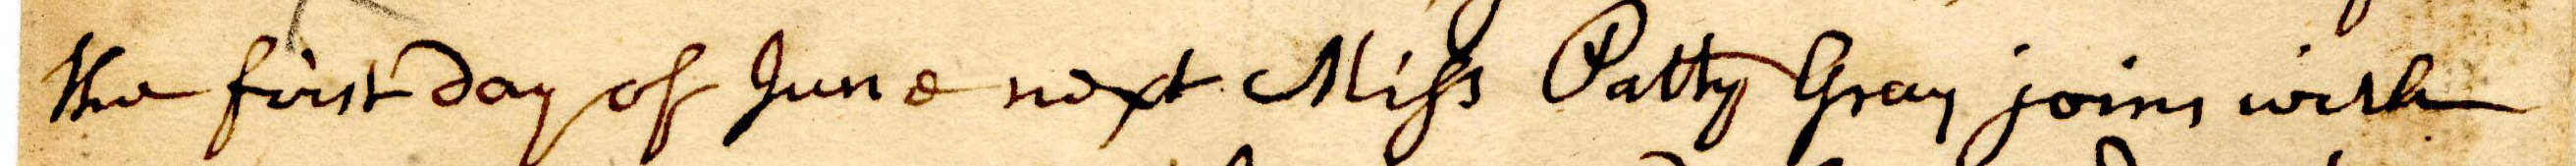the first day of June next Miss Patty Gray joins with
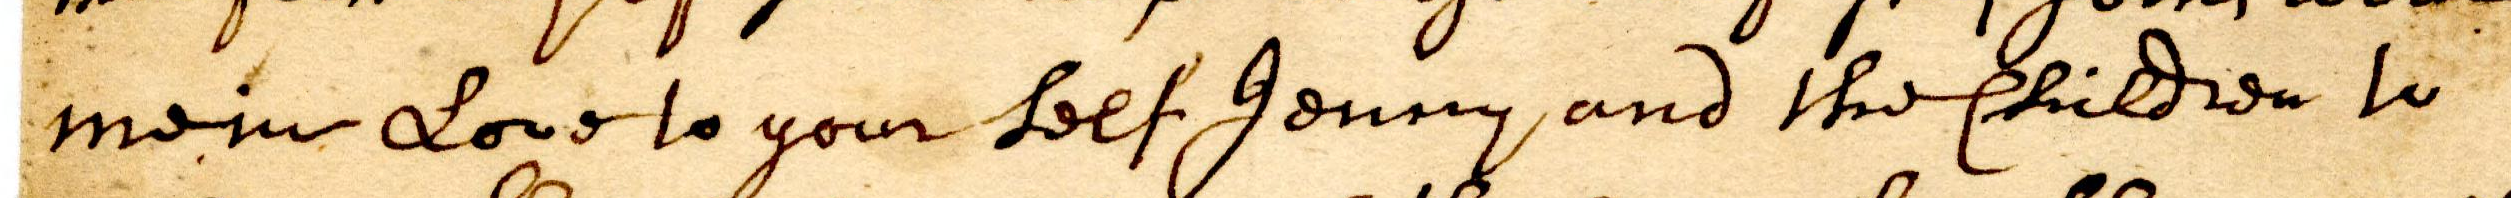me in Love to your Self Jenny, and the Children to
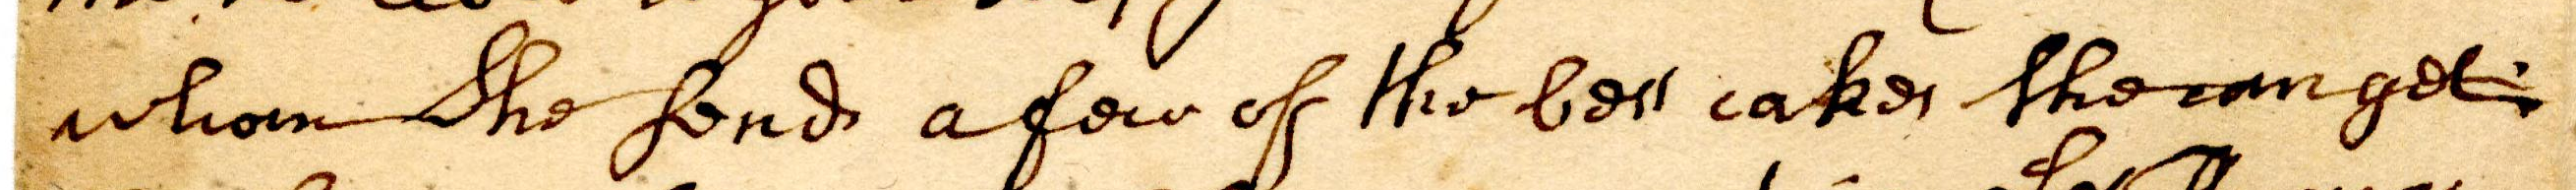whom she sends a few of the best cakes she can get.
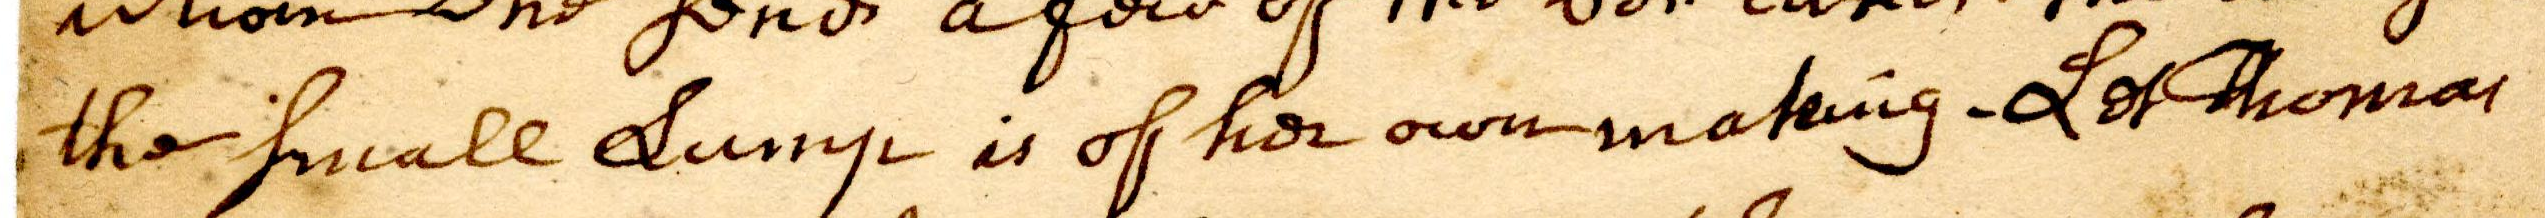the small Lump is of her own making. Let Thomas
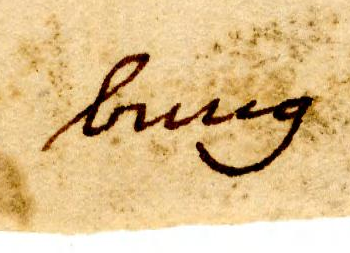bring
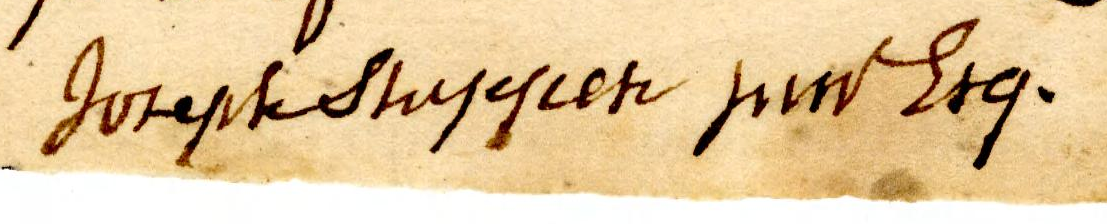Joseph Shippen Jun Esq.
